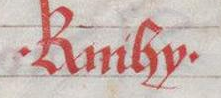.Kníhy.
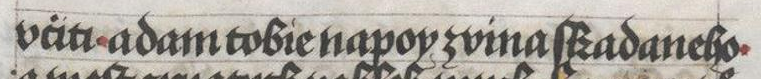uċiti.a dam tobie napoy zvína ſkadaneho.
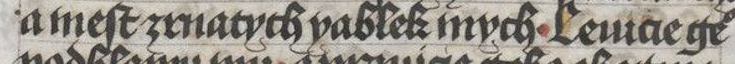a meſt zrnatych yablek mych.Leuicie geo
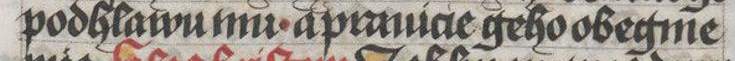podhlawu mu.a prauicie geho obegme
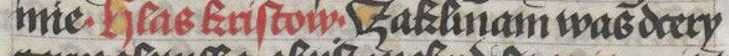mie.Hlas kriſtow.Zaklinam was dcery
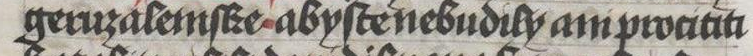geruzalemſke.abyẛte nebudily ani procititi
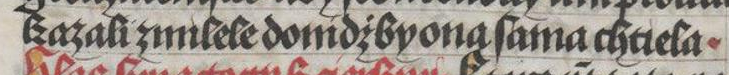kazali zmilele donidżby ona ſama chtiela.
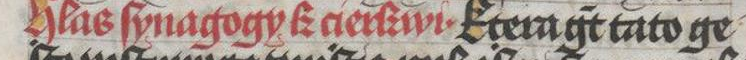Hlas ſynagogy k cíerkwi.Ktera ḡt tato ge¬
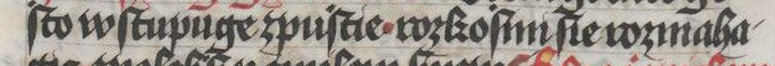ẛto wſtupuge zpuẛtie.rozkoẛni ſie rozmaha¬
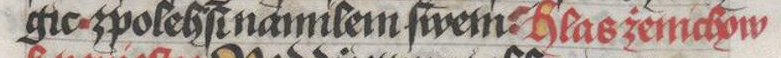gic. zpolehẛi na milem ſwem? Hlas żenichow
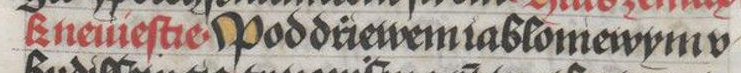kneuíeſtie.Pod dṙiewem iabloniewym v¬
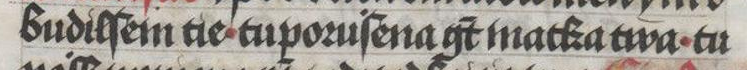budilſem tie.tu poruẛena ḡt matka twa.tu
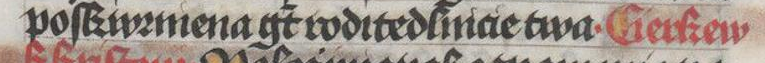poẛkwrniena ḡt roditedlnicie twa.Cíerkew
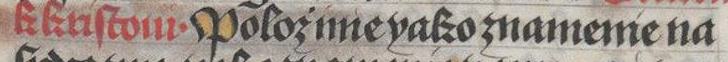k kriſtoui.Poloż mie yako znamenie na
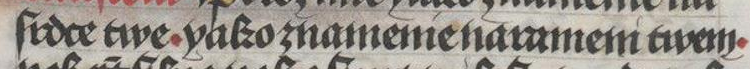ſrdce twe.yako znemeníe narameni twem.
